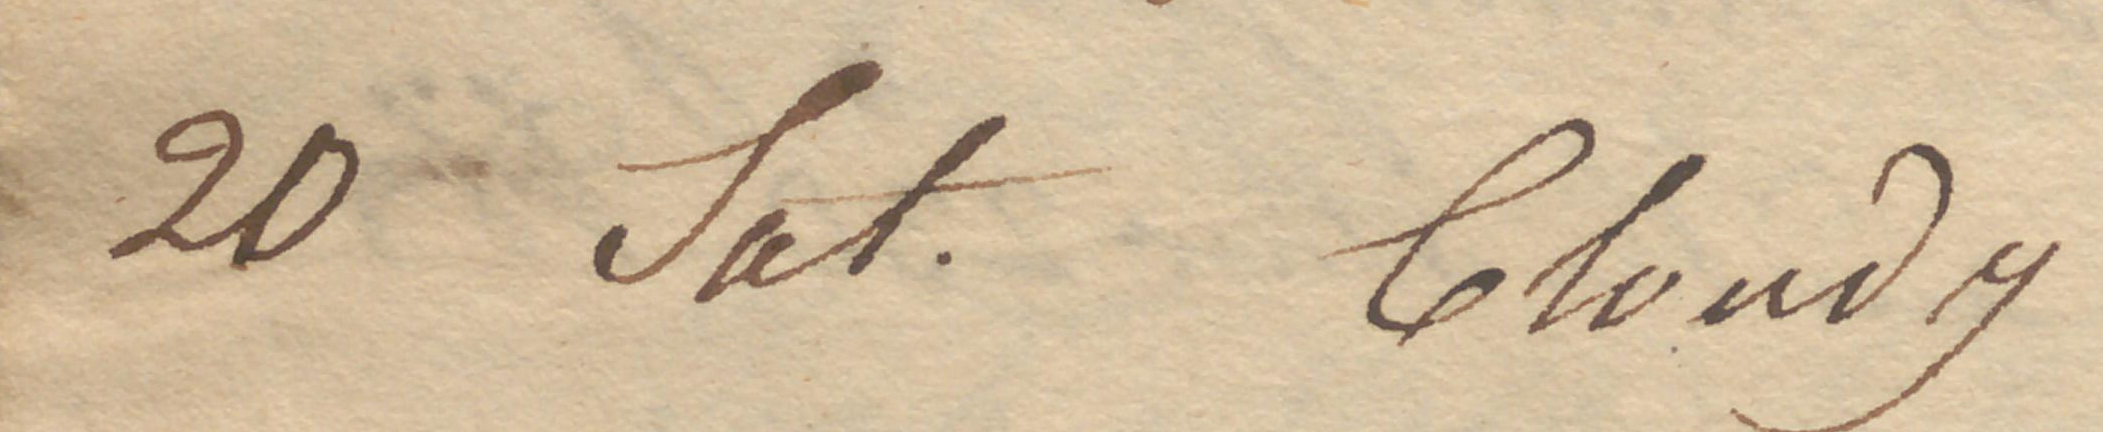20 Sat. Cloudy
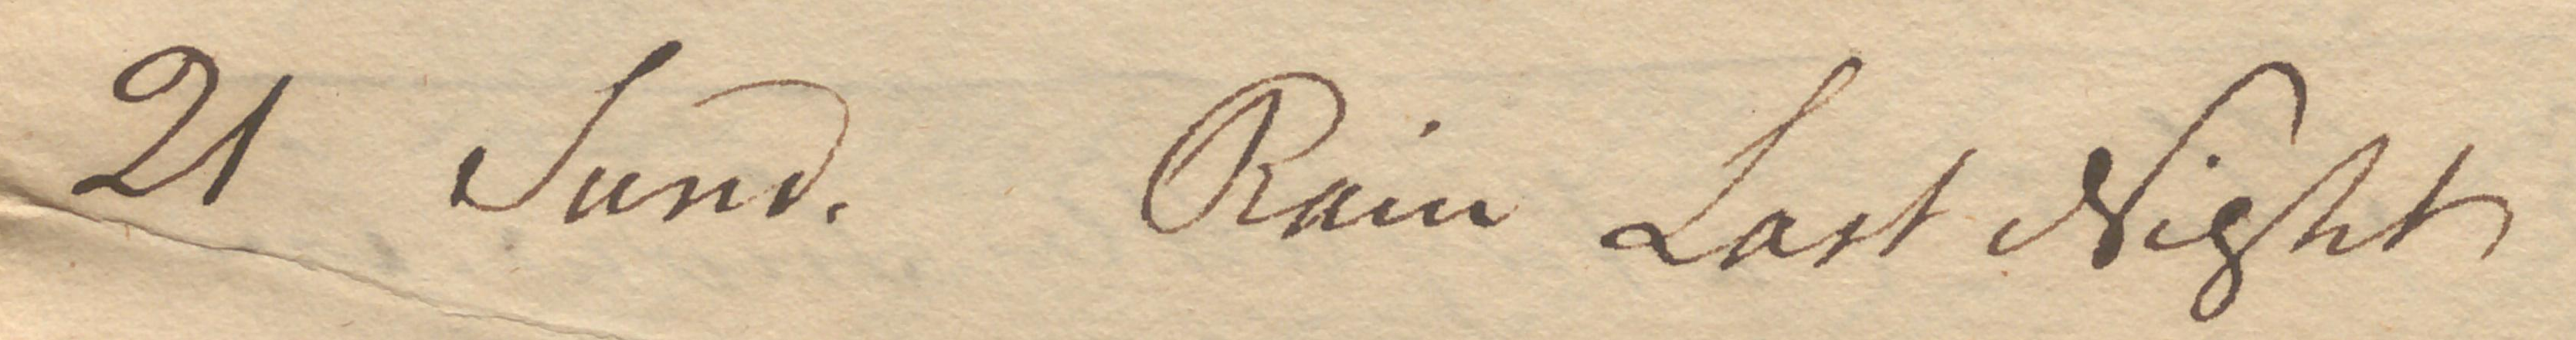21 Sund. Rain Last Night
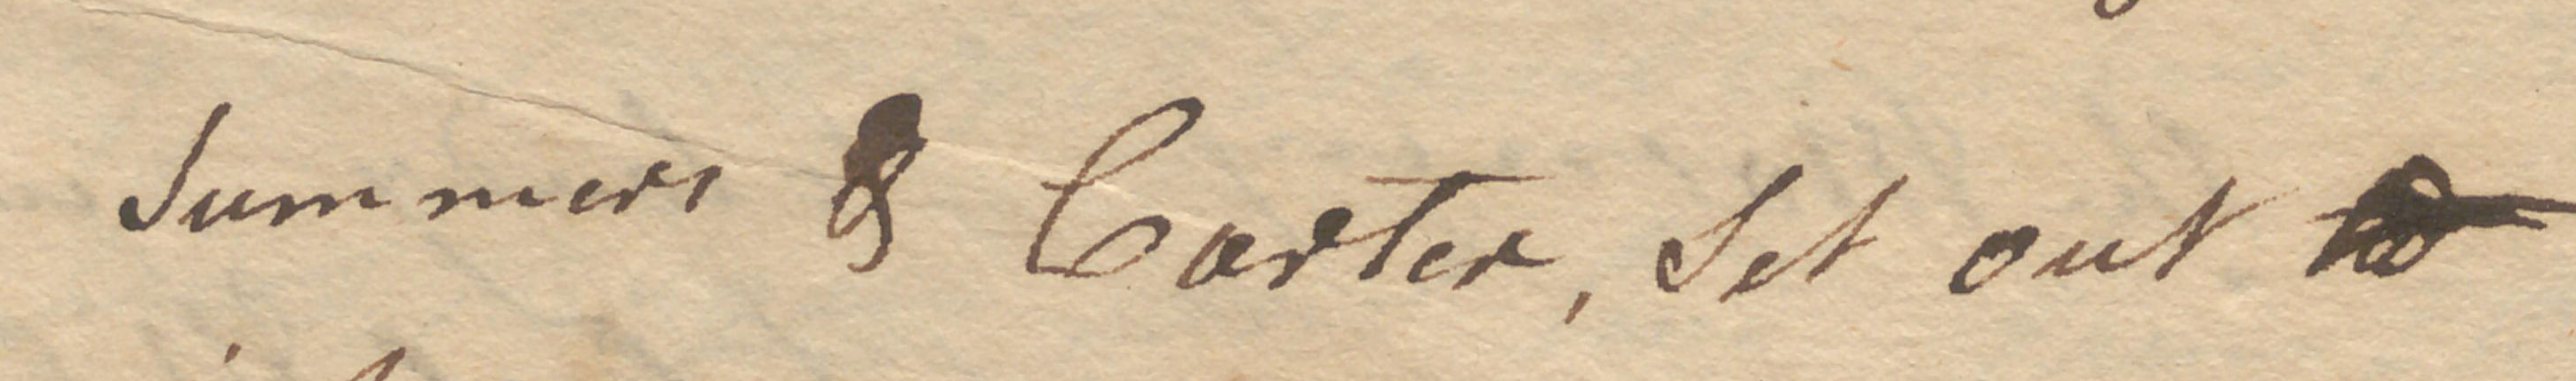Summers & Carter set out [to]
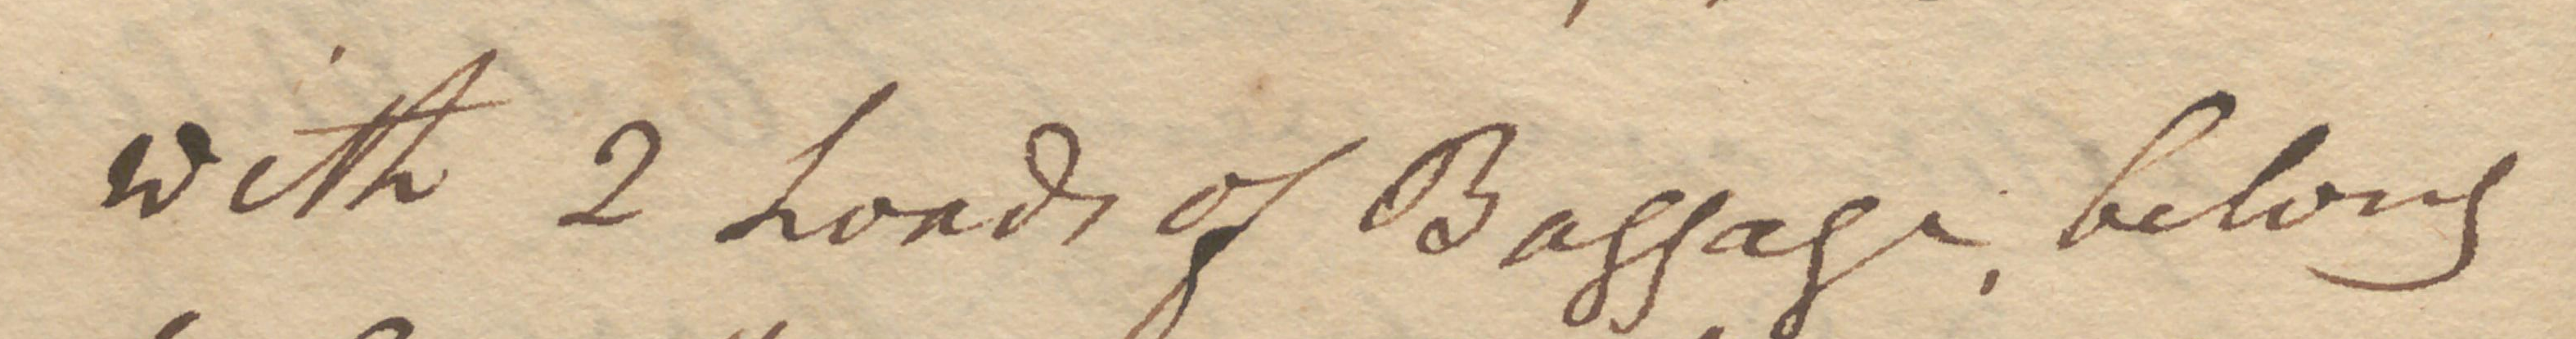with 2 Loads of Baggage belong
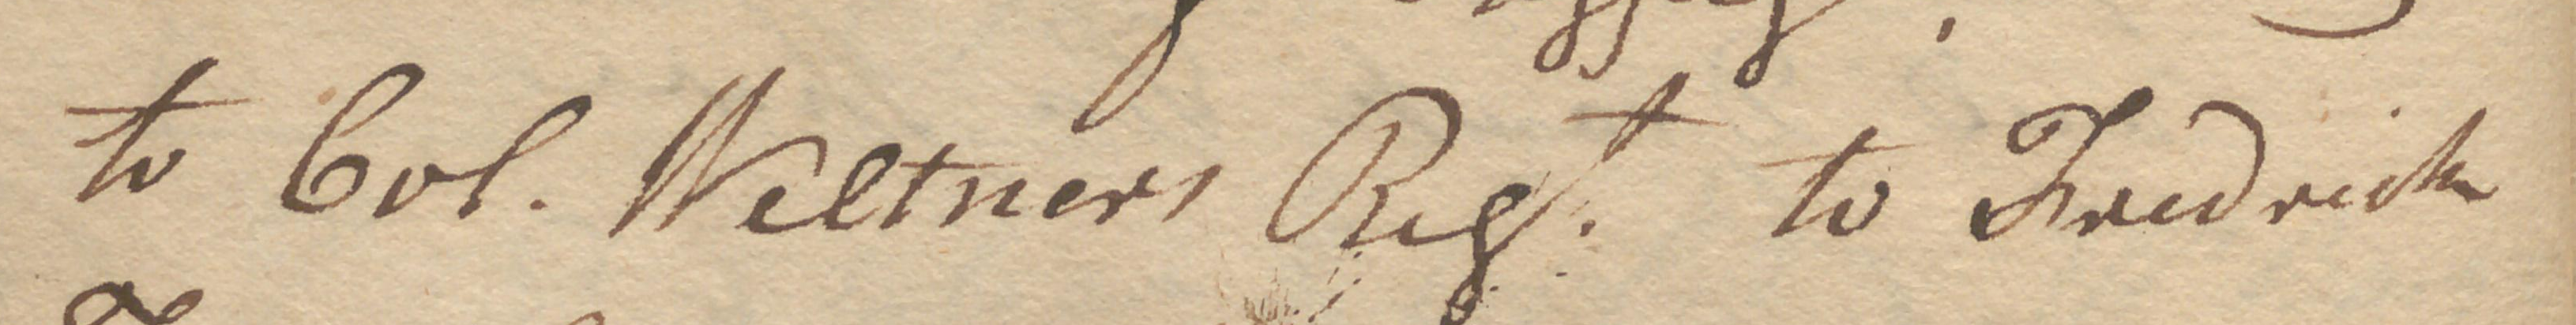to Col. Weltners Reg^t. to Fredrick
